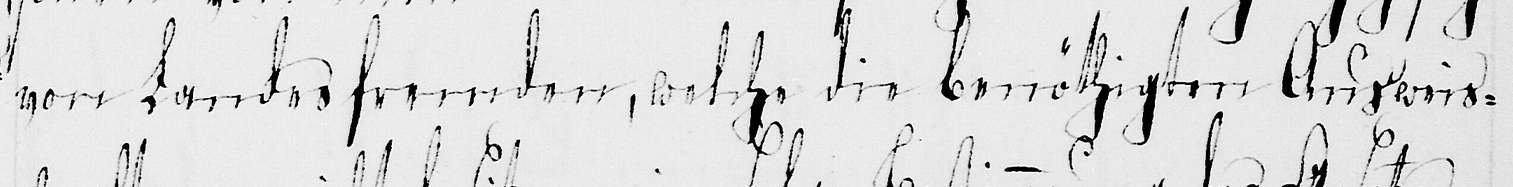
von Landesfremden, welche die benöthigten Ausweis¬
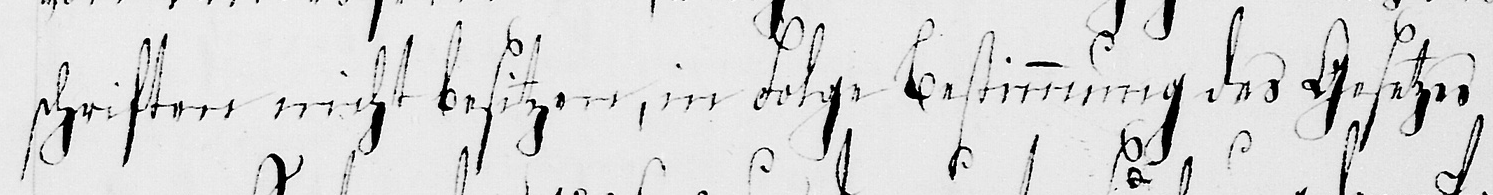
schriften nicht besitzen, in Folge Bestimmung des Gesetzes
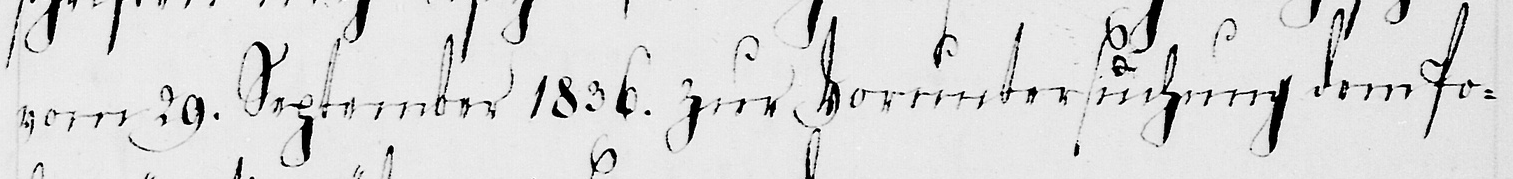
vom 29. September 1836. zur Voruntersuchung dem Po¬
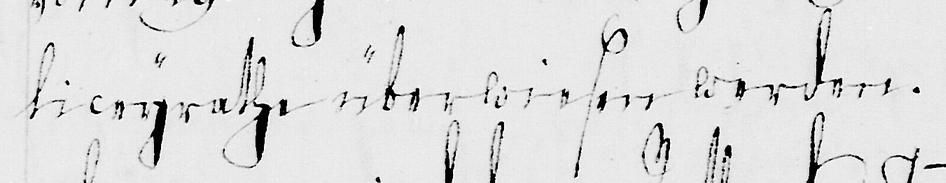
liceyrathe überwiesen werden.
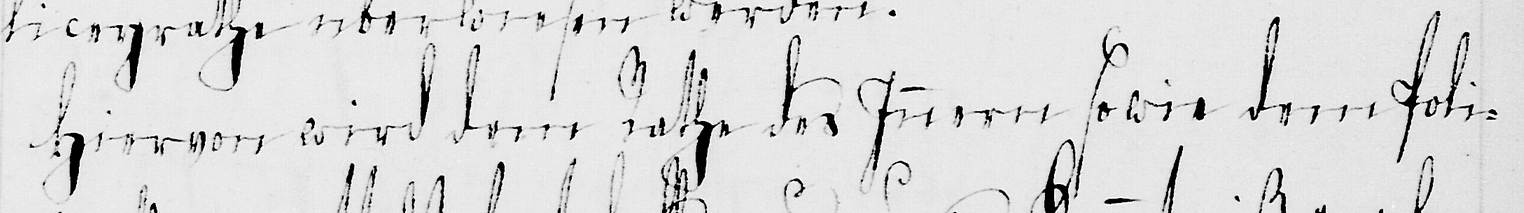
Hiervon wird dem Rathe des Innern sowie dem Poli¬
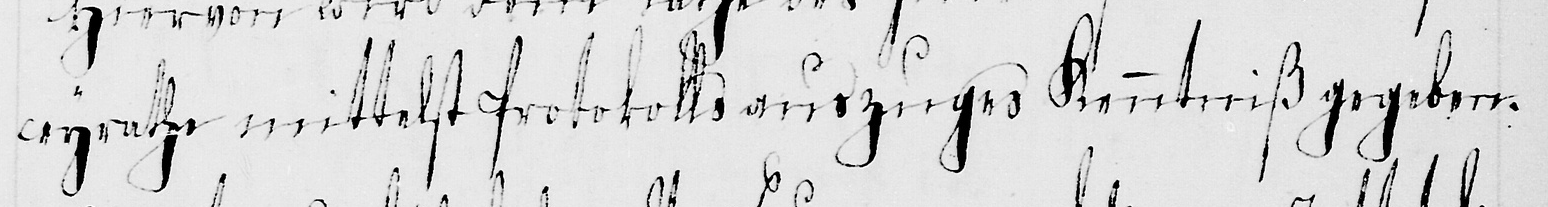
ceyrathe mittelst Protokollsauszuges Kenntniß gegeben.
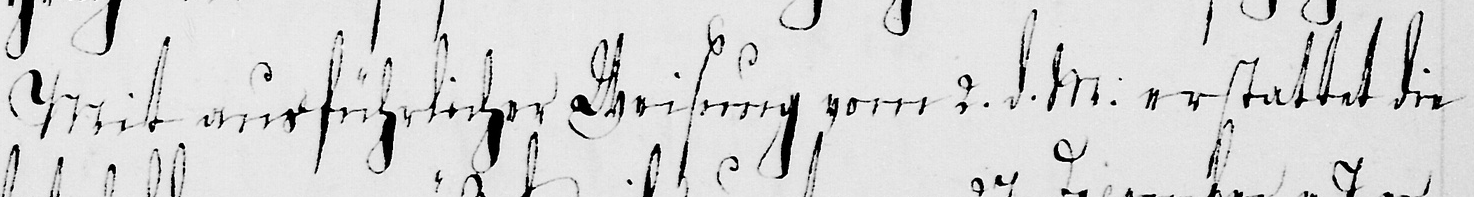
Mit ausführlicher Weisung vom 2. d. M. erstattet die
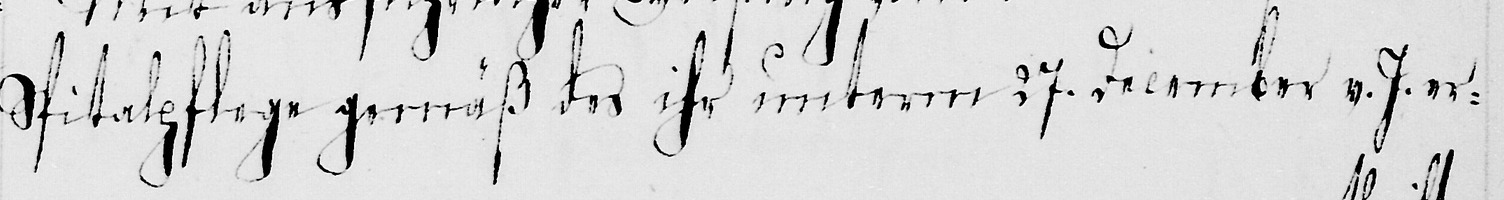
Spitalpflege gemäß des ihr unterm 27. December v. J. er-
